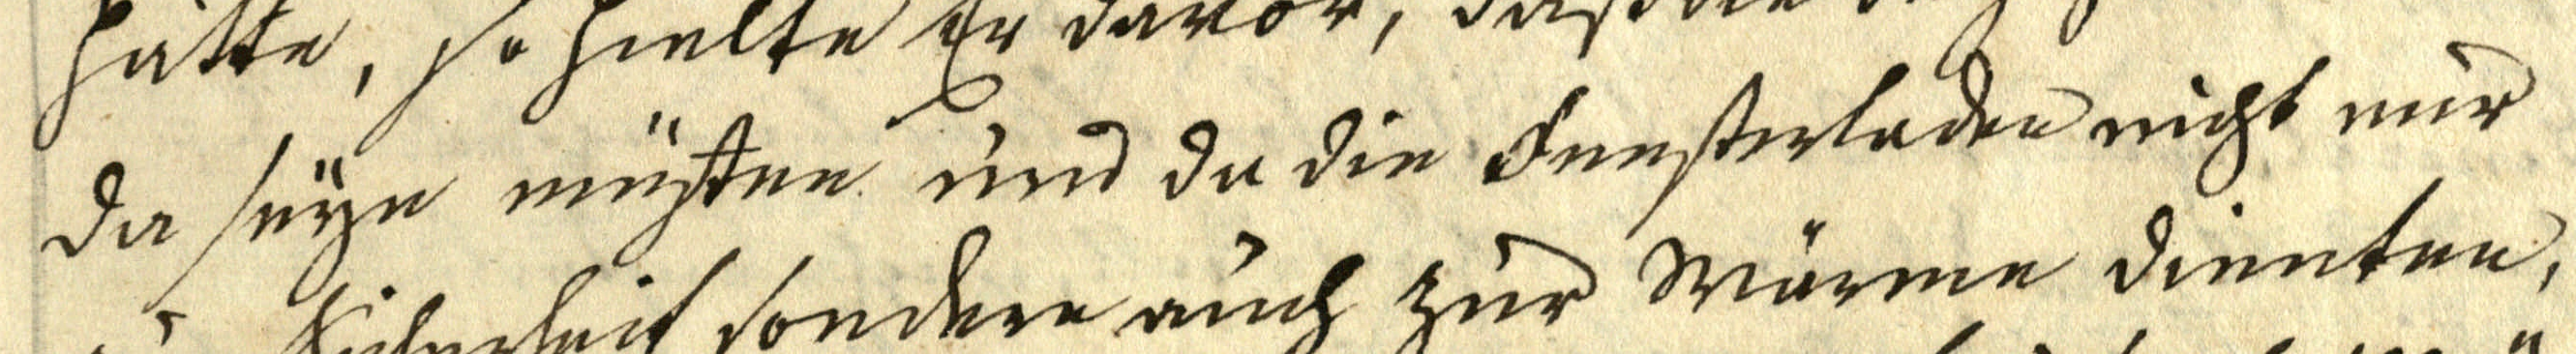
da seÿn müsten und da die Fensterladen nicht nur
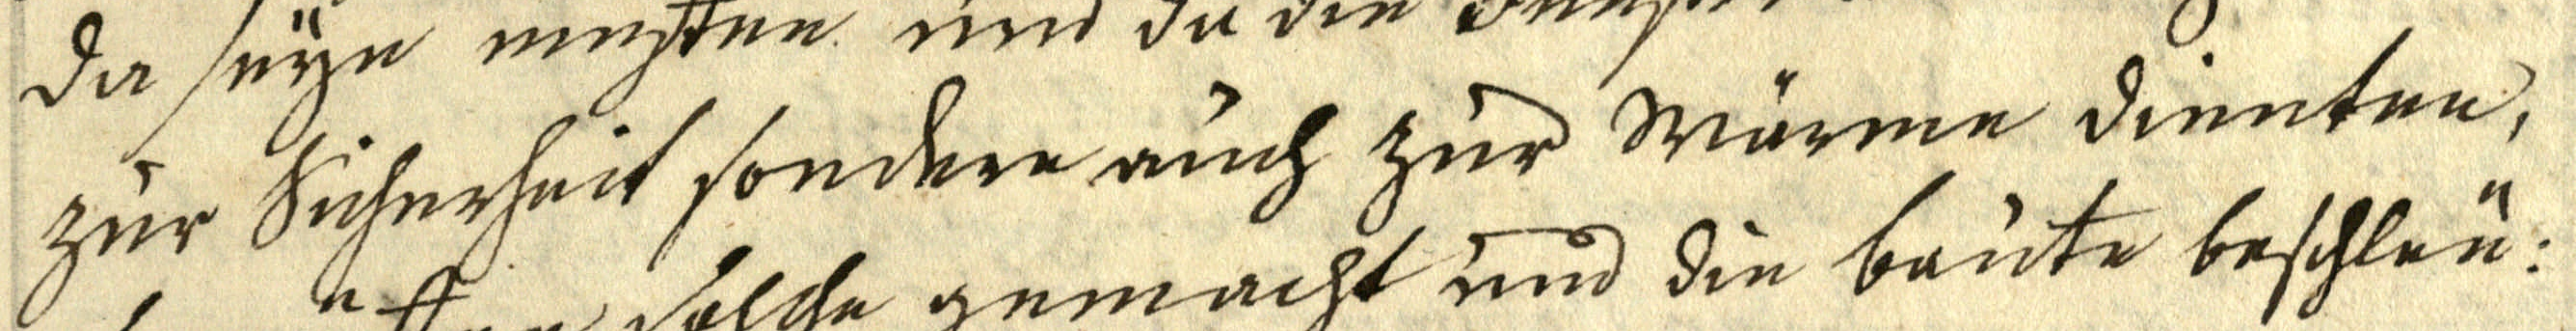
zur Sicherheit sondern auch zur Wärme dienten,
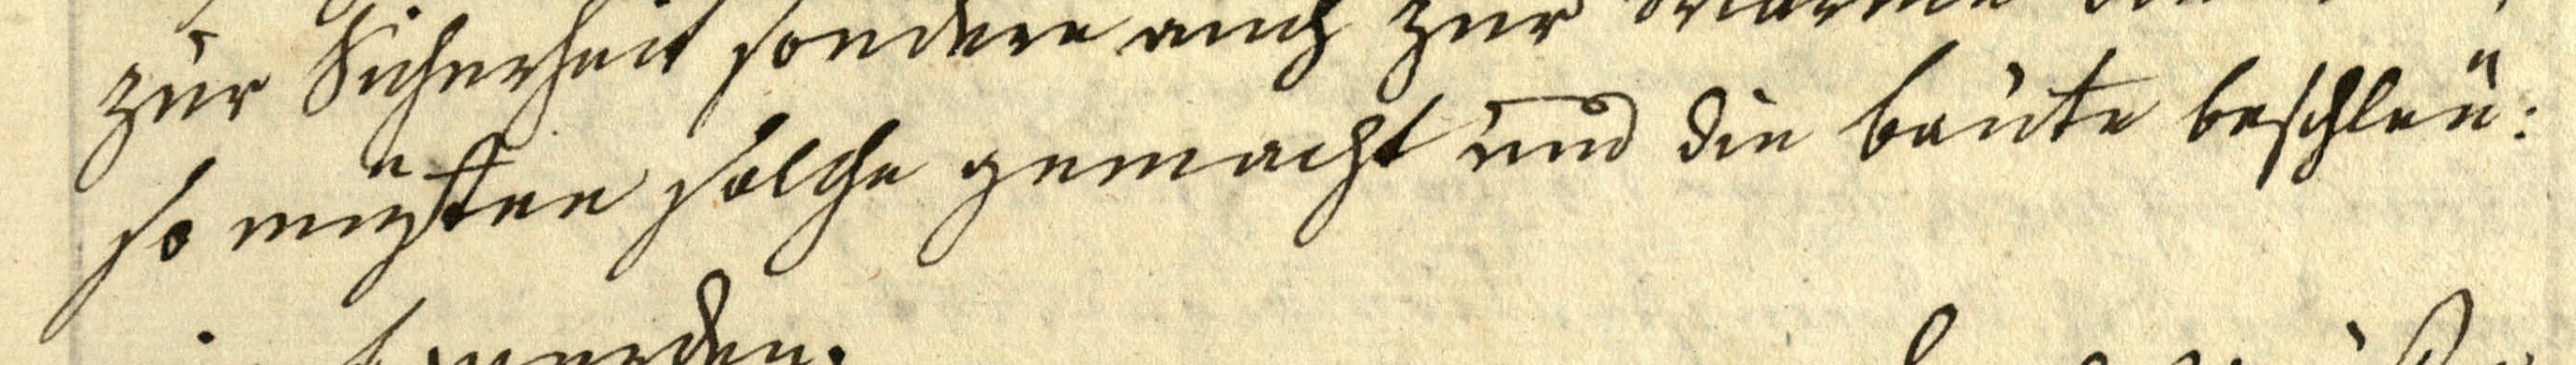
so müsten solche gemacht und die Baute beschleu¬
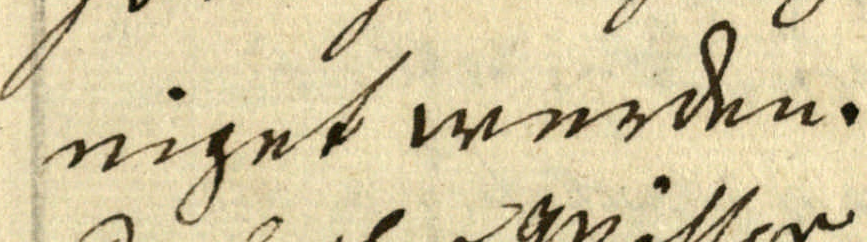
niget werden.
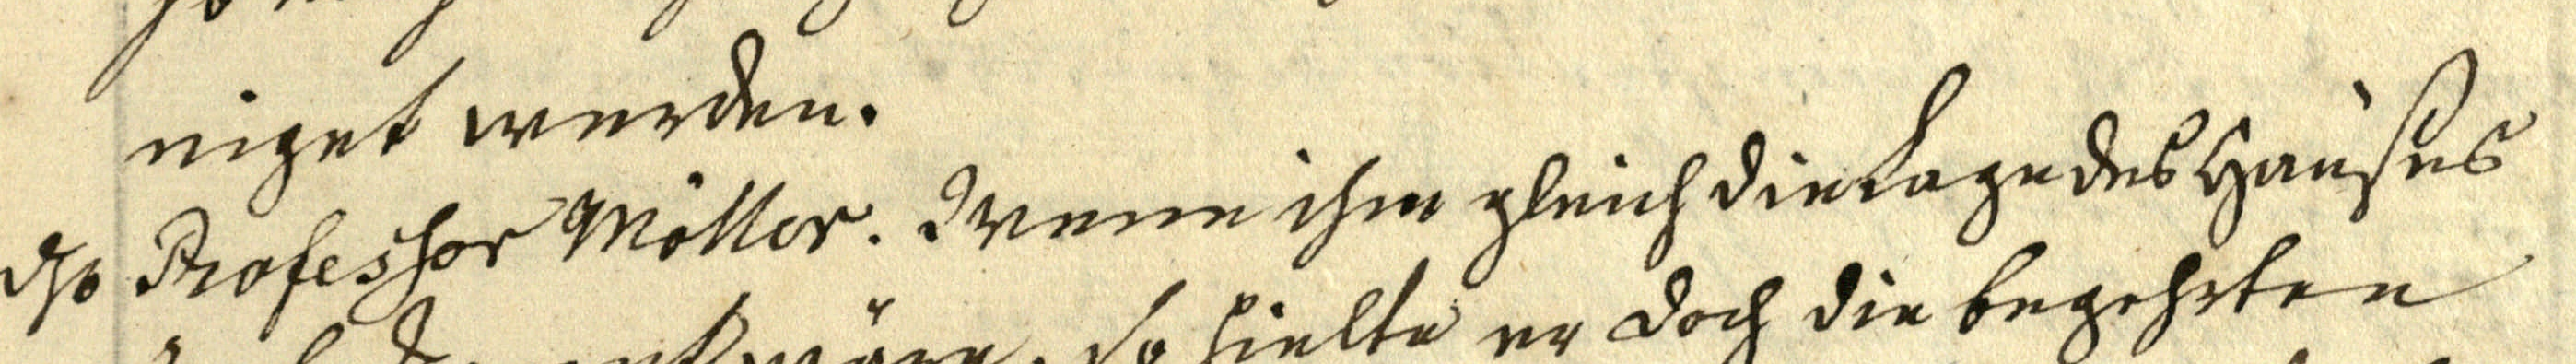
dh Professor Möller. Wenn ihm gleich die Lage des Haußes
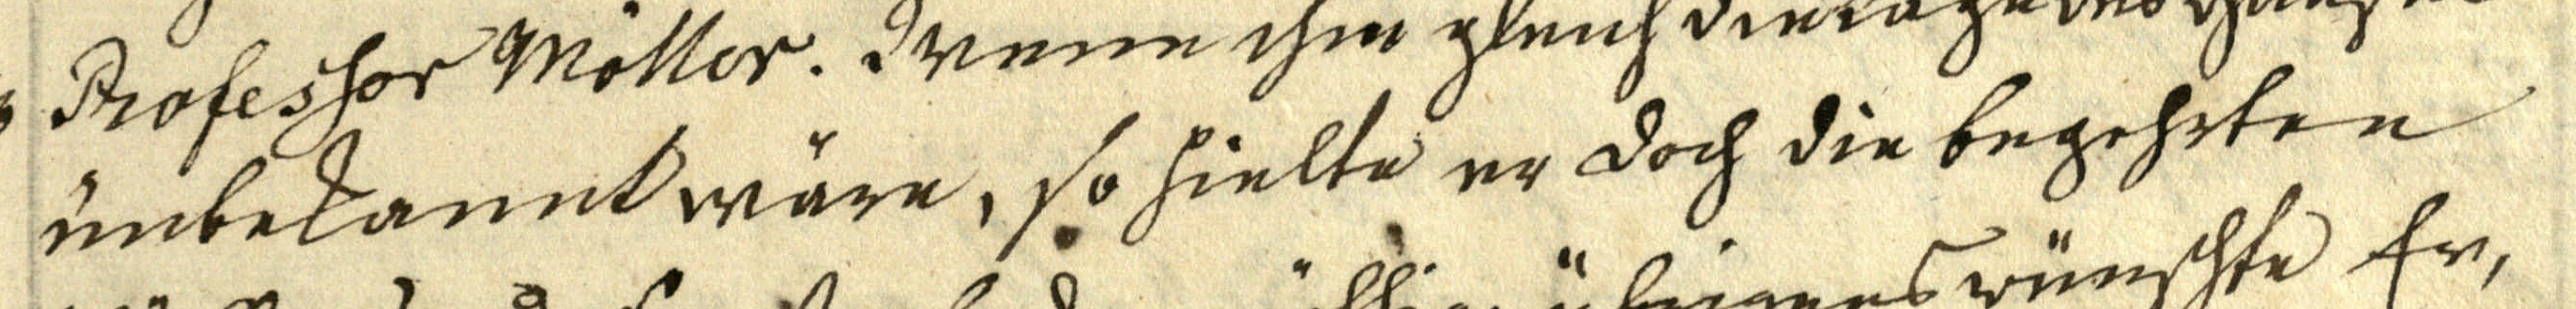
unbekannt wäre, so hielte er doch die begehrten
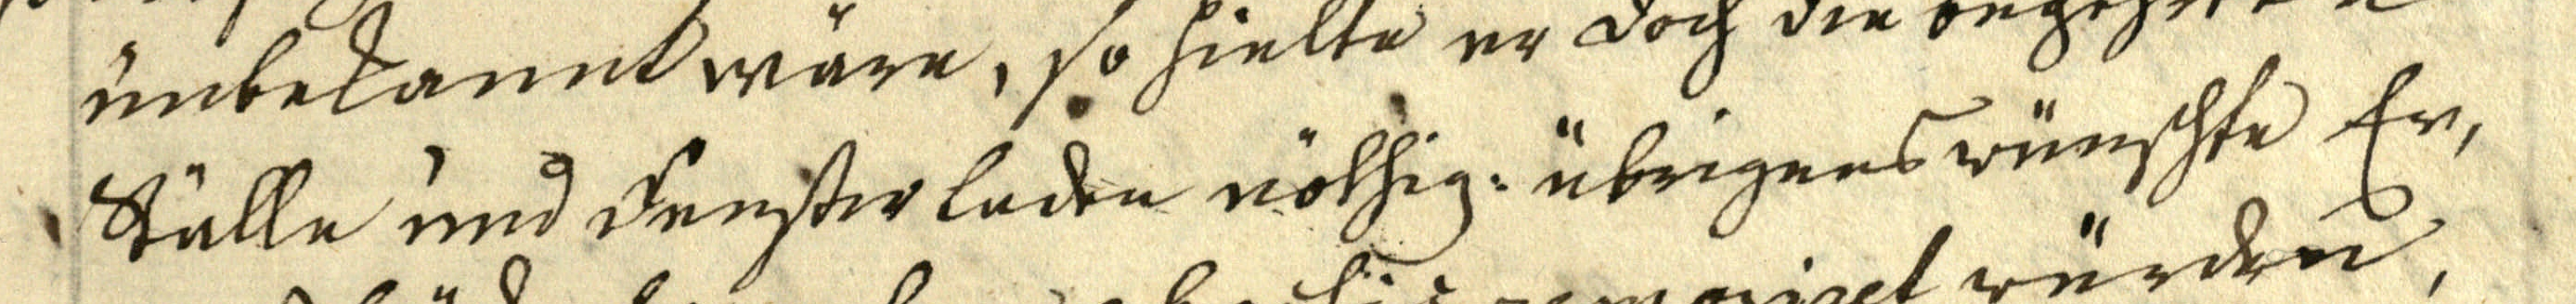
Ställe und Fensterladen nöthig. übrigens wünschte Er,
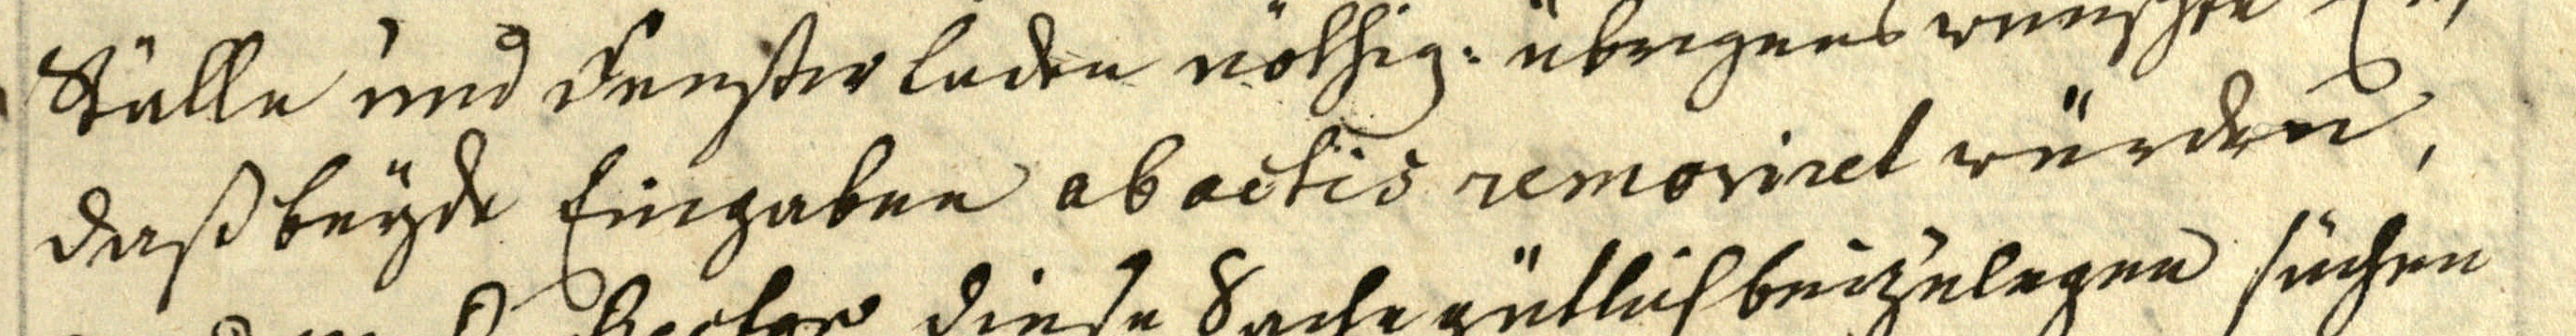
daß beÿde Eingaben ab actis removiret würden,
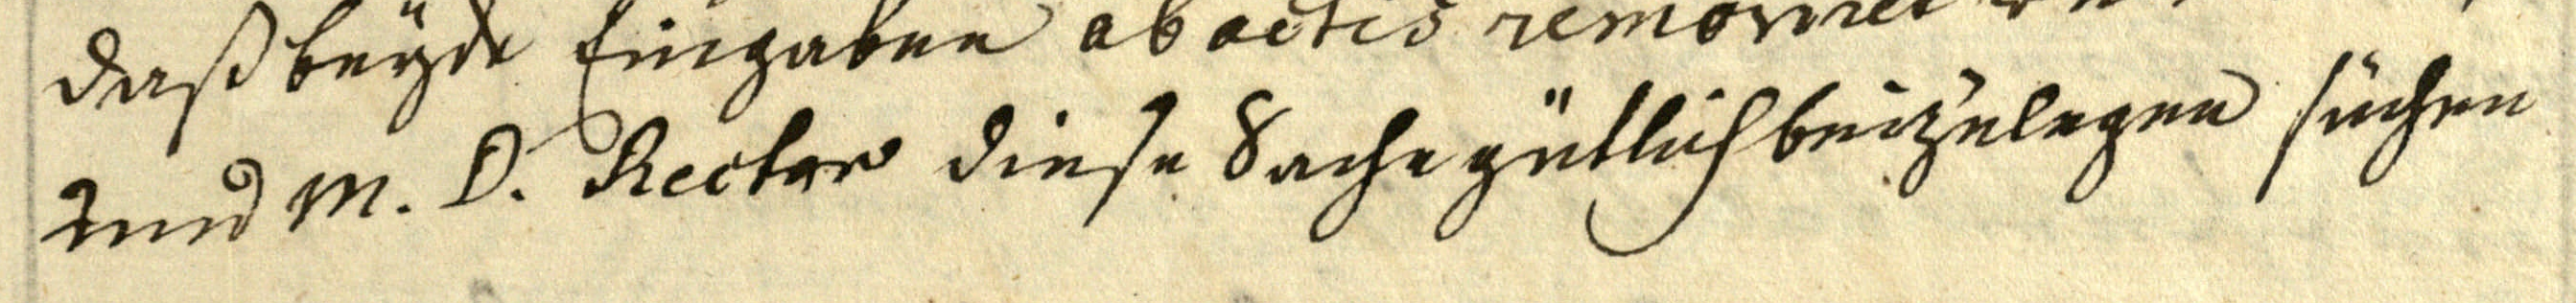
und M. D. Rector diese Sache gütlich beizulegen suchen
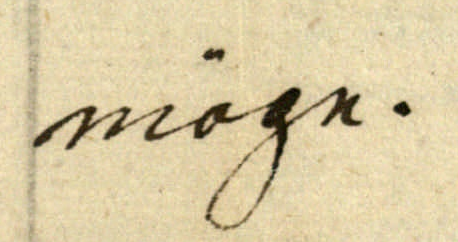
möge.
